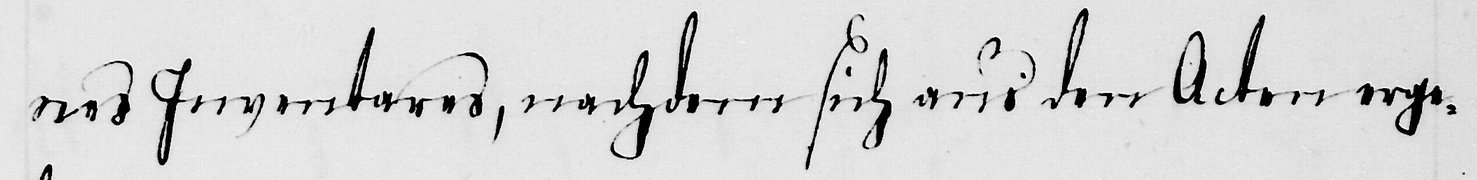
nes Inventares, nachdem sich aus den Acten erge¬
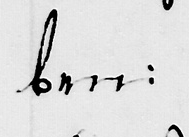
den
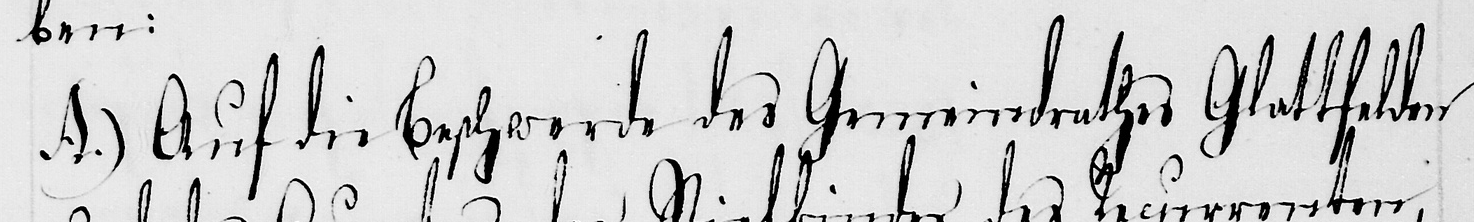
A.) Auf die Beschwerde des Gemeindrathes Glattfel¬
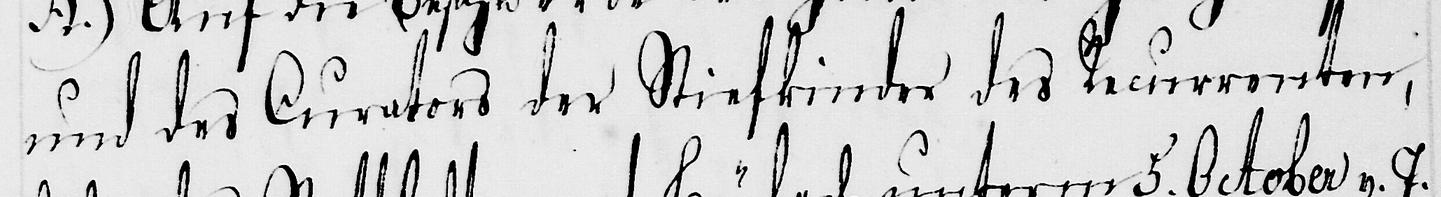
und des Curators der Stiefkinder des Recurrenten,
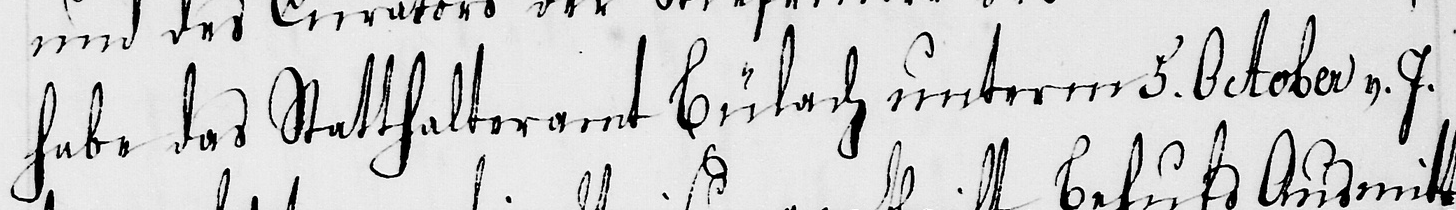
habe das Statthalteramt Bülach unterm 5. October v. J.
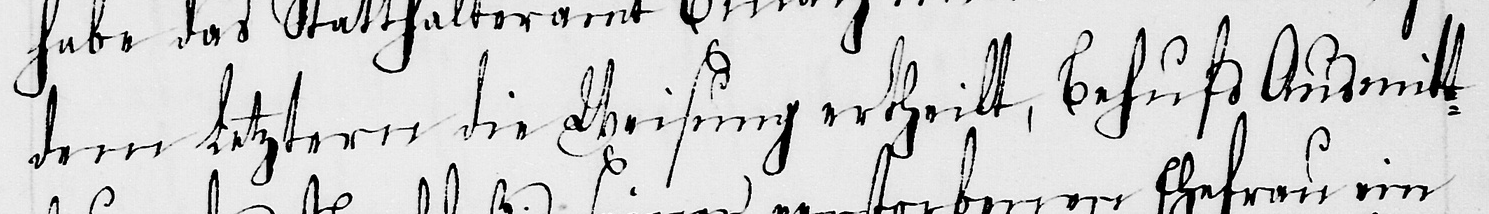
dem Letztern die Weisung ertheilt, Behufs Ausmitt¬
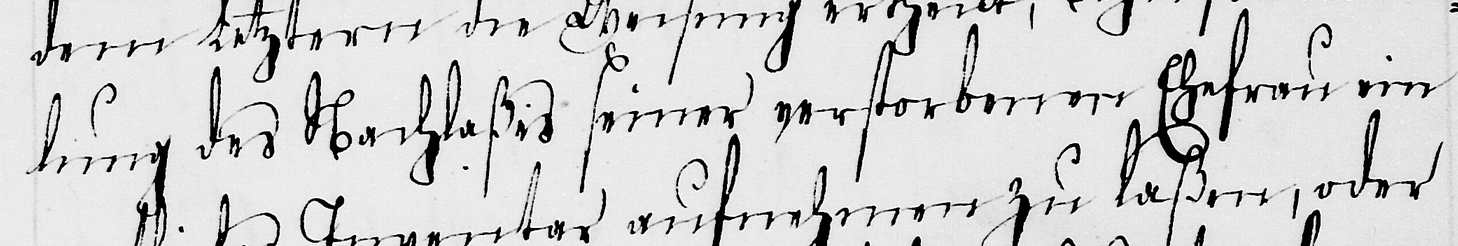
lung des Nachlaßes seiner verstorbenen Ehefrau ein
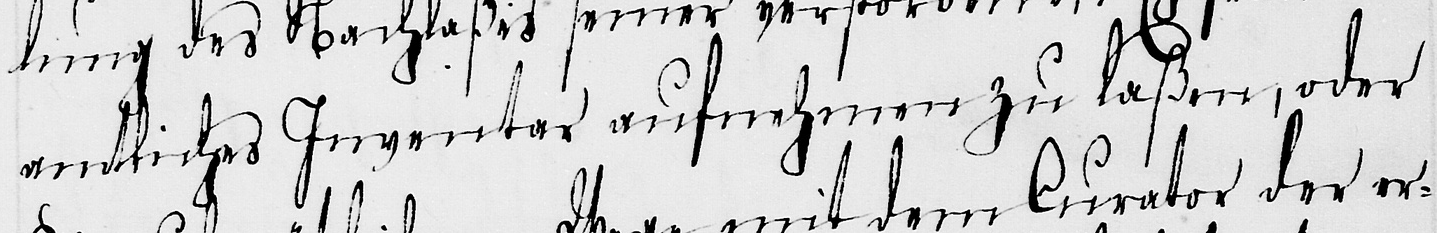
amtliches Inventar aufnehmen zu laßen, oder
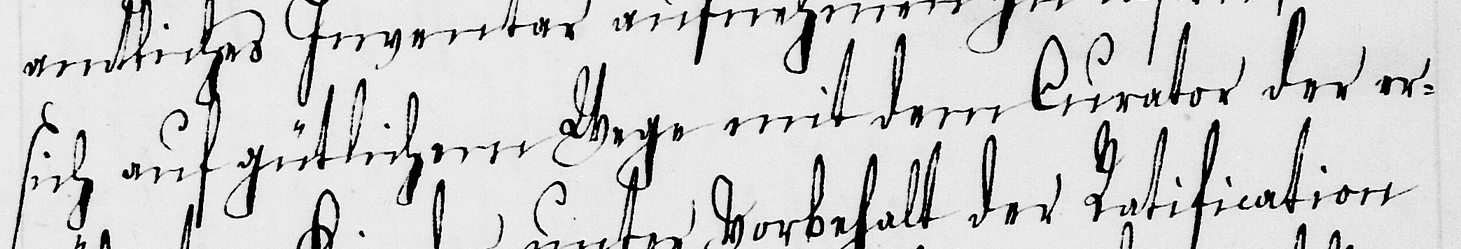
sich auf gütlichem Wege mit dem Curator der er¬
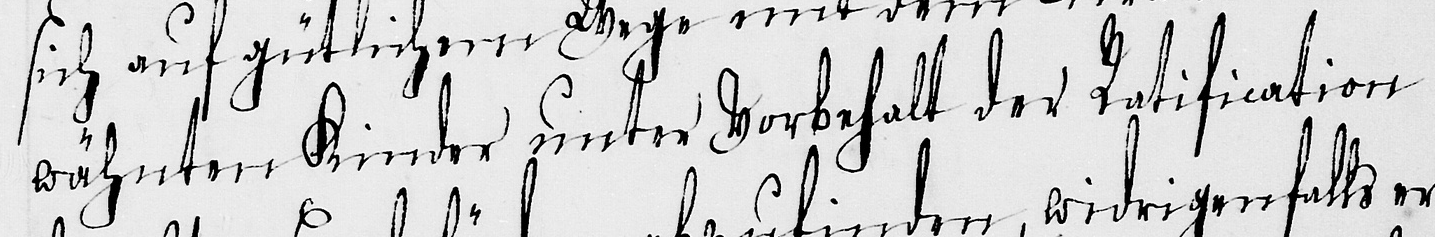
wähnten Kinder unter Vorbehalt der Ratification
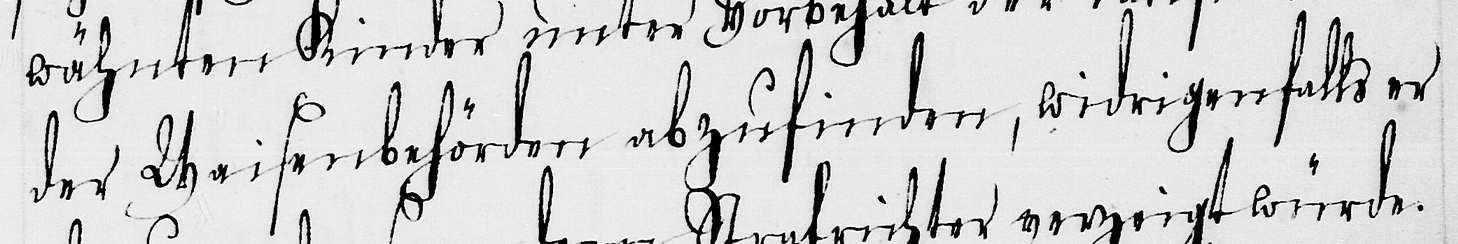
der Waisenbehörden abzufinden, widrigenfalls
